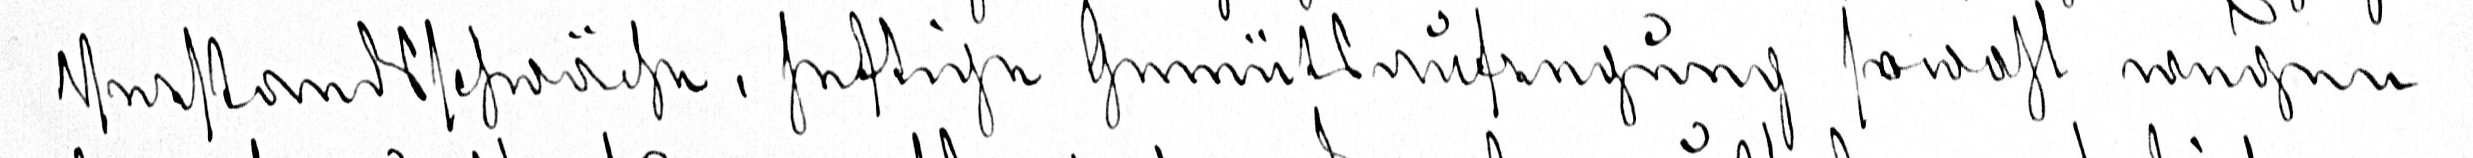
Verstandsschwäche, heftige Gemütsaufregung sowohl wegen
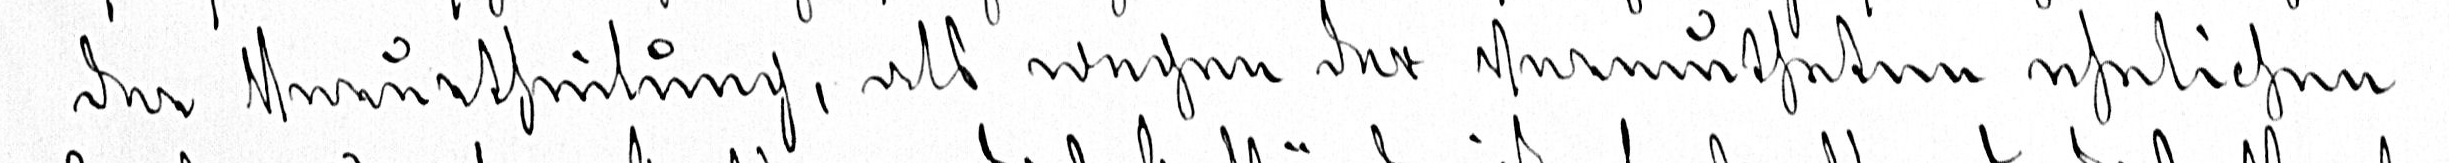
der Verurtheilung, als wegen der Vermutheten ehelichen
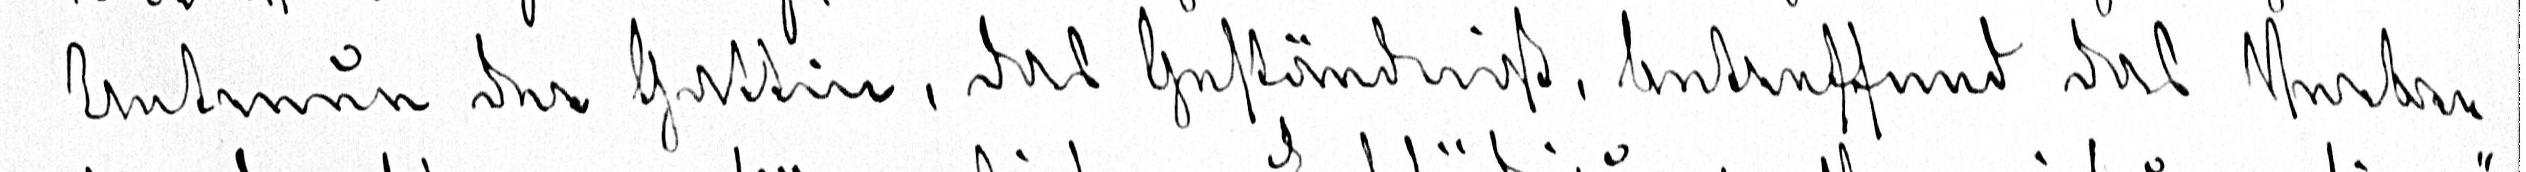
Untreue der Gattin, das Geständniß, betreffend das Verbre¬
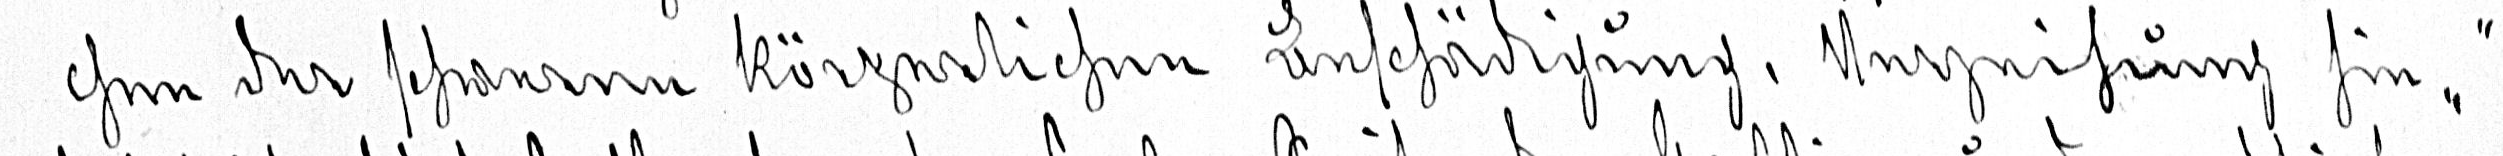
chen der schweren körperlichen Beschädigung, Verzeihung hin¬
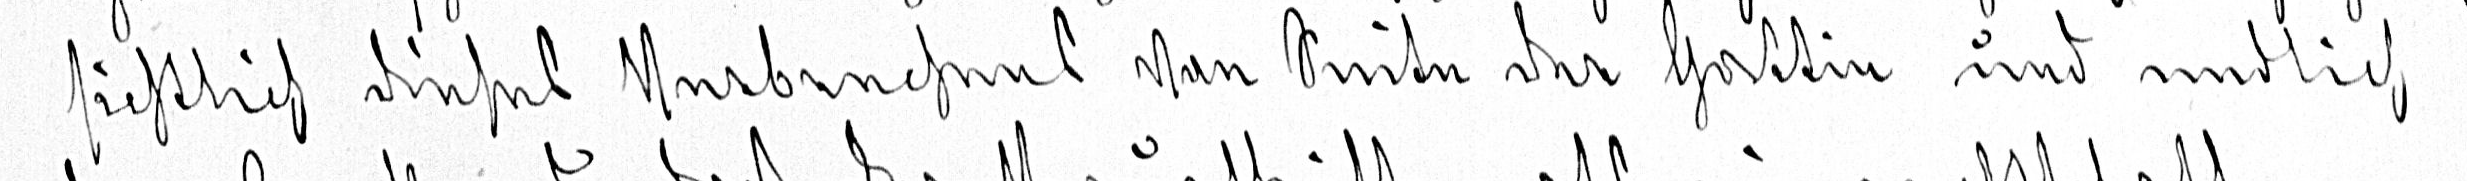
sichtlich dieses Verbrechens von Seite der Gattin und endlich
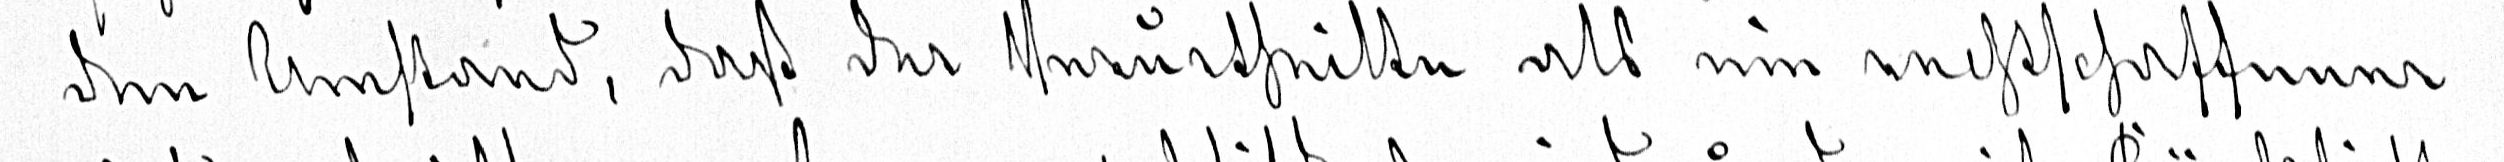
den Umstand, daß der Verurtheilte als ein rechtschaffener
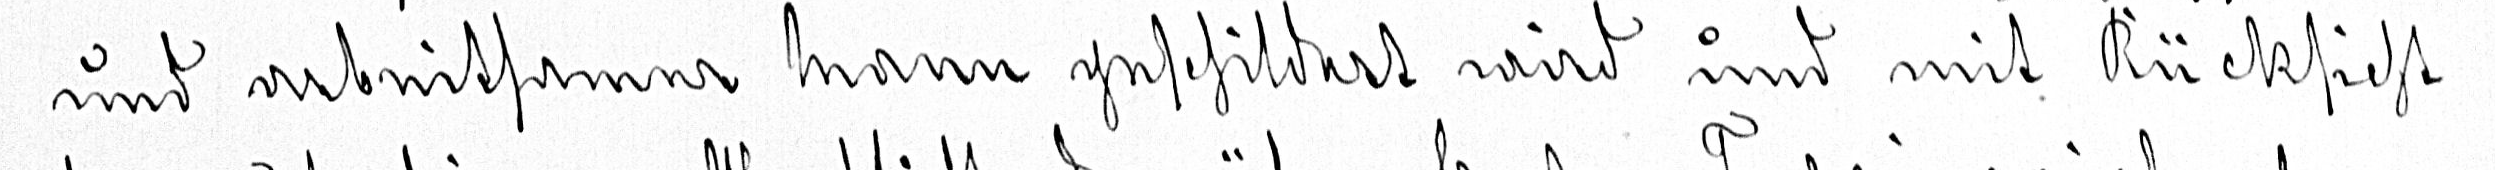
und arbeitsamer Mann geschildert wird und mit Rücksicht
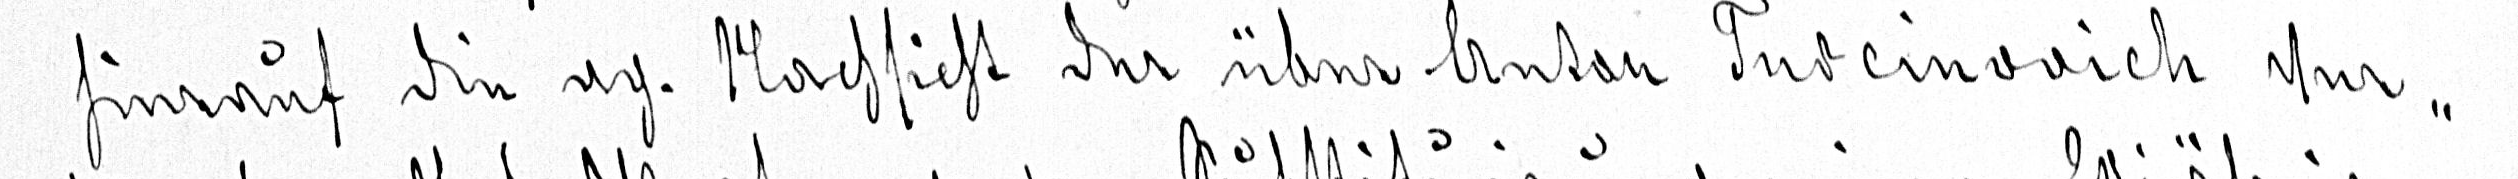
hierauf die ag. Nachsicht der über Anton Turcinovich Ver¬
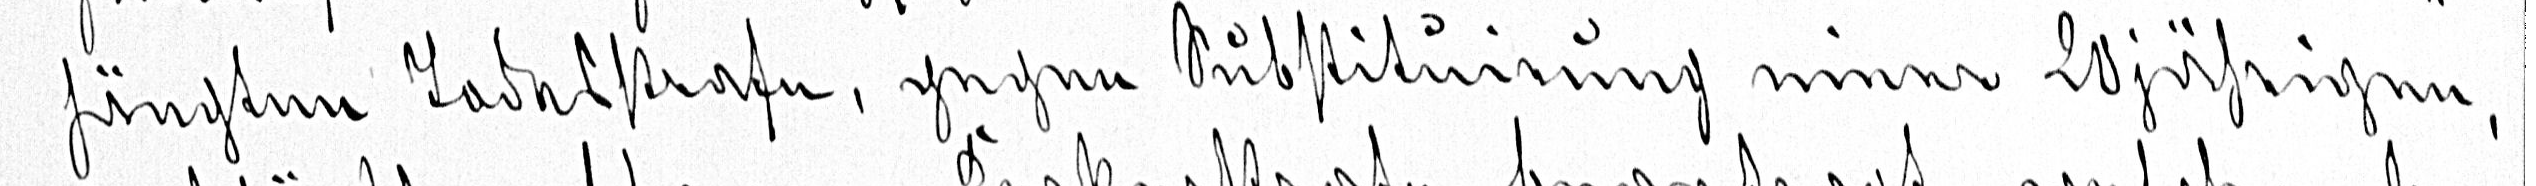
hängten Todesstrafe, gegen Substituirung einer 20jährigen,
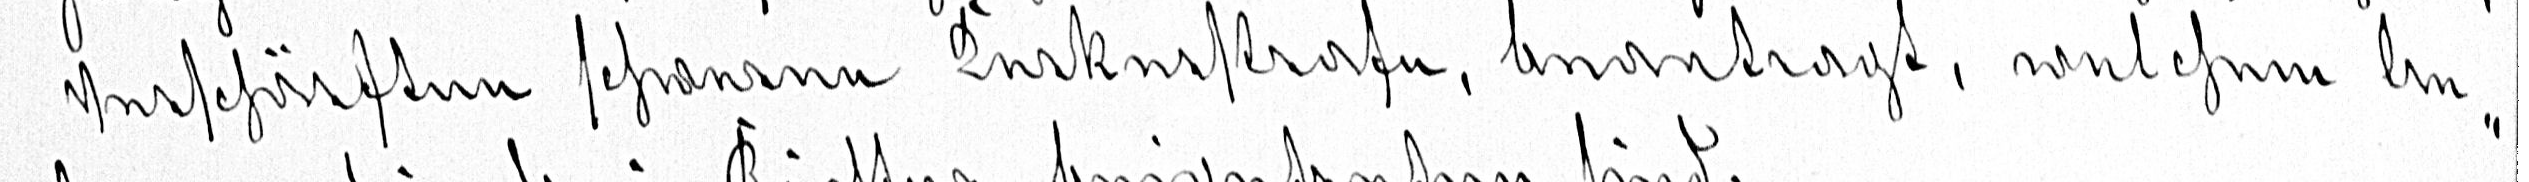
Verschärften schweren Kerkerstrafe, beantragt, welchem An¬
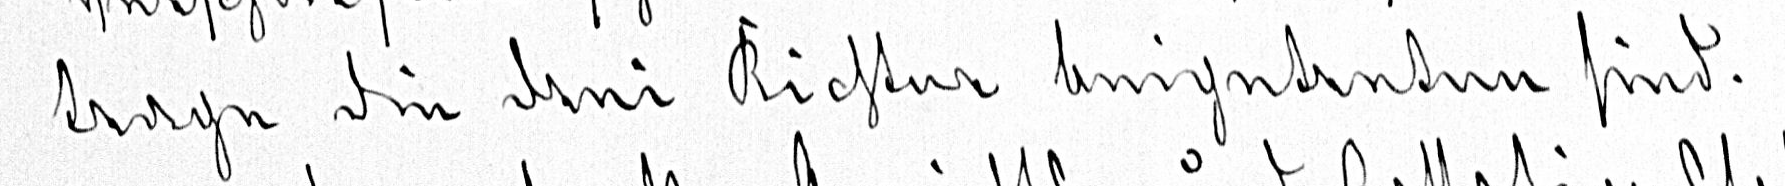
trage die drei Richter beigetreten sind.
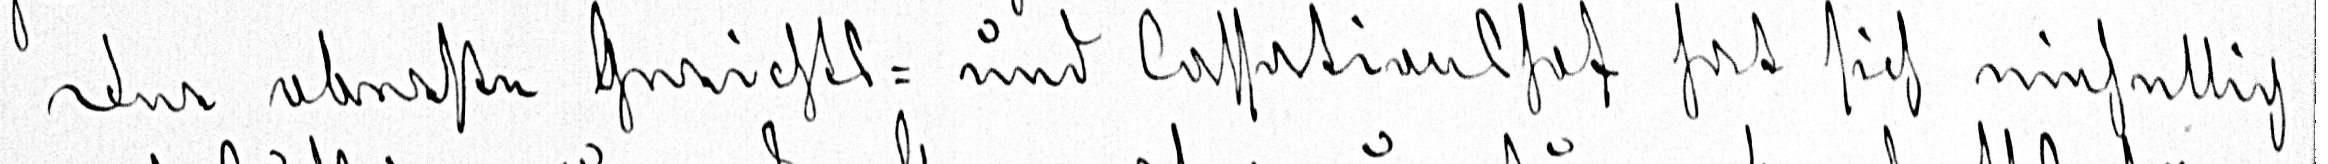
Der oberste Gerichts- und Cassationshof hat sich einhellig
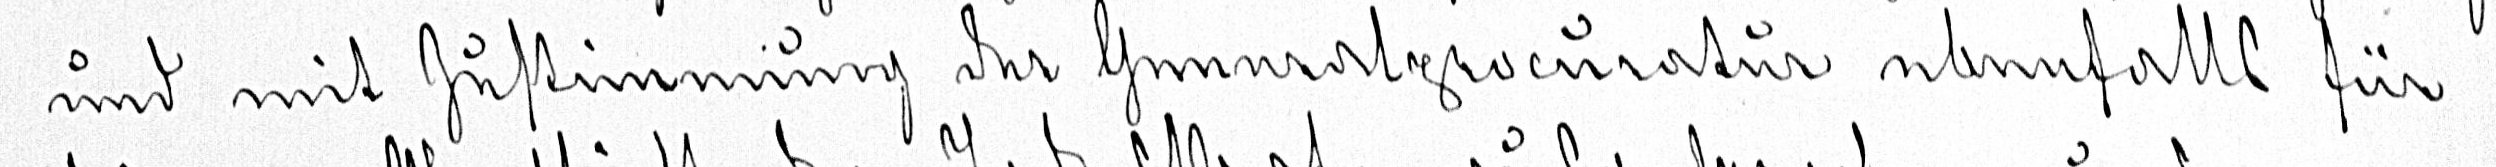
und mit Zustimmung der Generalprocuratur ebenfalls für
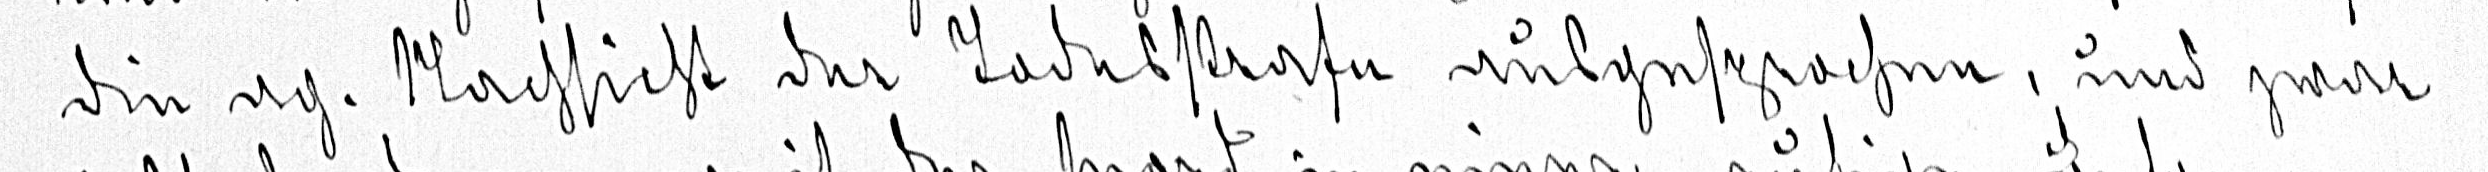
die ag. Nachsicht der Todesstrafe ausgesprochen, und zwar
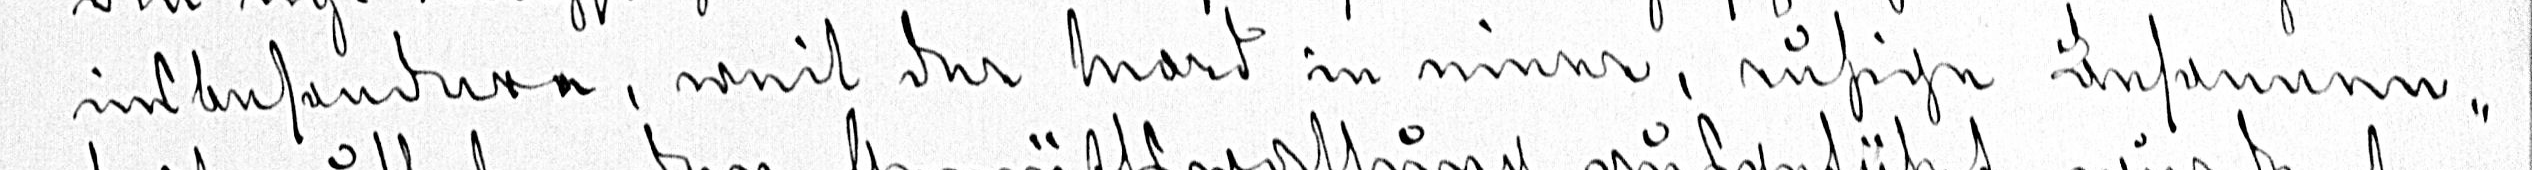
insbesondere, weil der Mord in einer, ruhige Besonnen¬
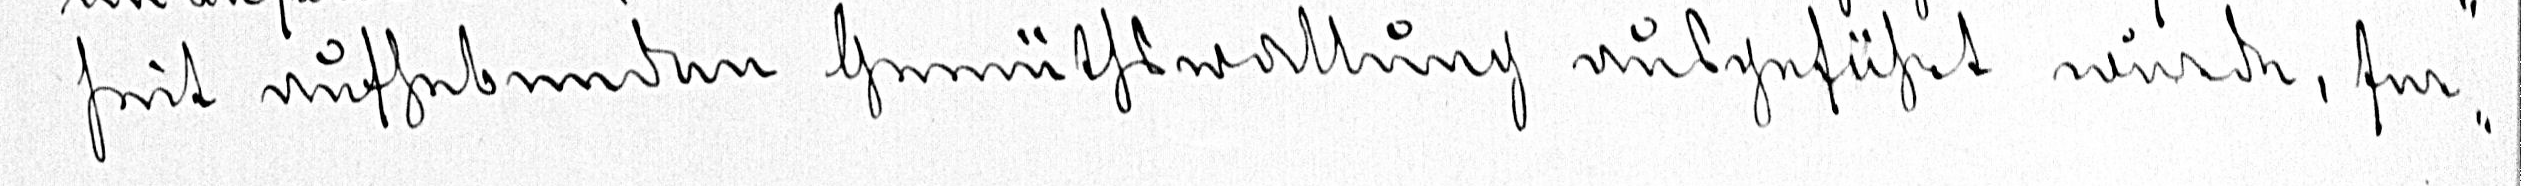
heit aufhebenden Gemüthswallung ausgeführt wurde, fer¬
